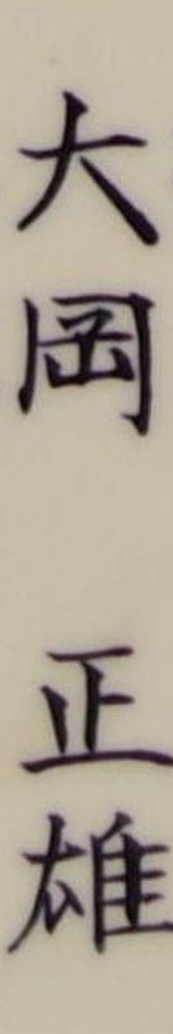大岡正雄
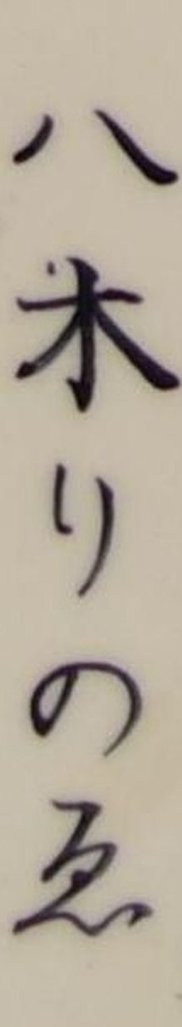八木りのゑ
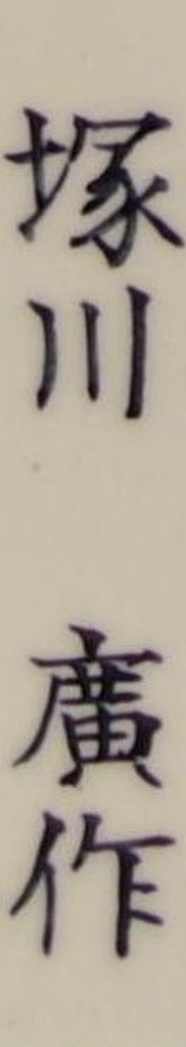塚川廣作
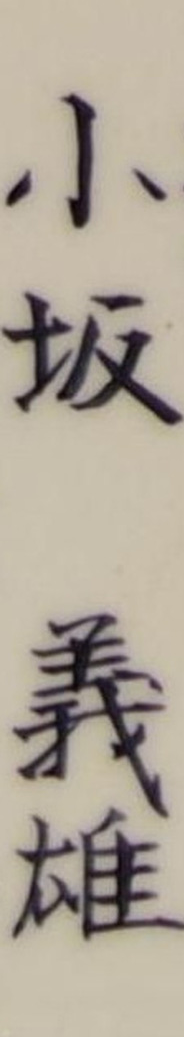小坂義雄
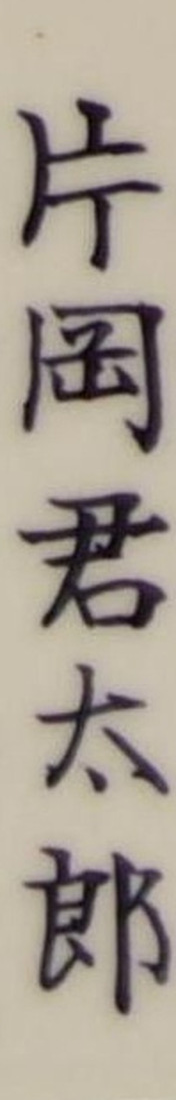片岡君太郎
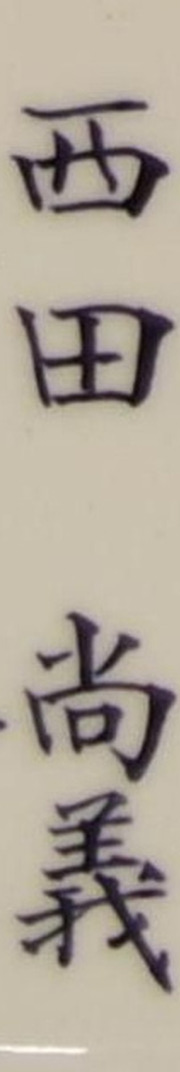西田尚義
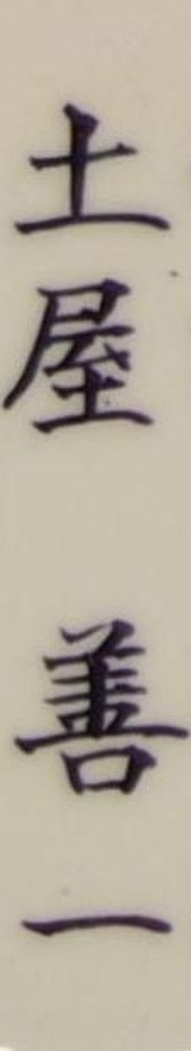土屋善一
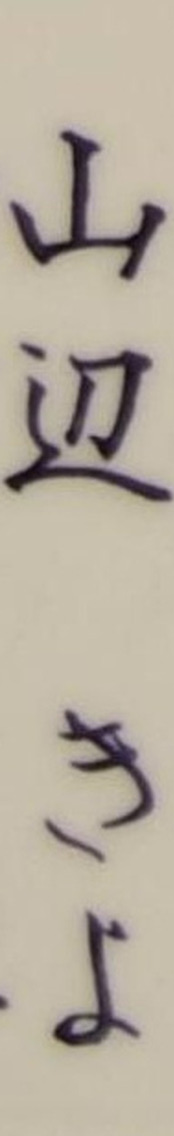山辺きよ

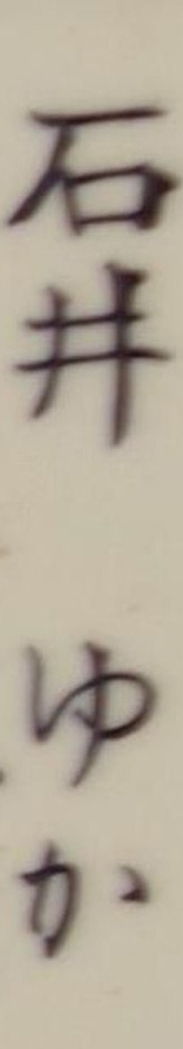石井ゆか
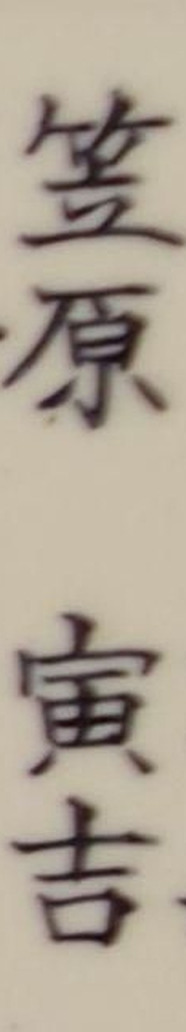笠原寅吉
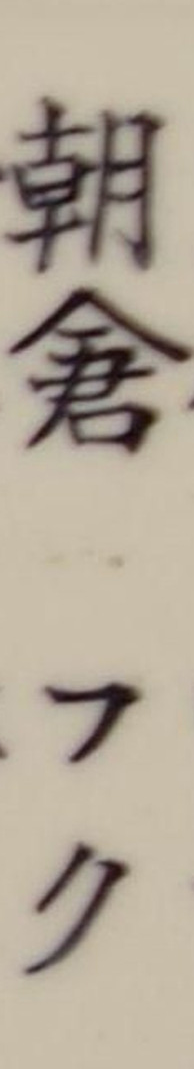朝倉フク
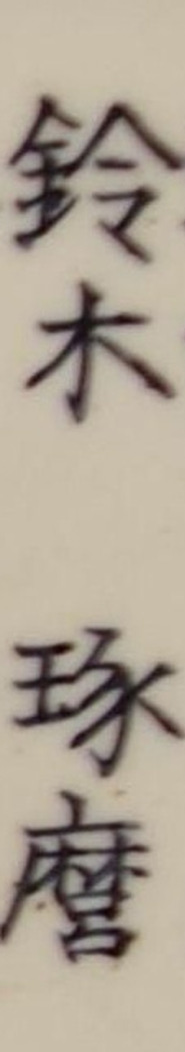鈴木琢麿
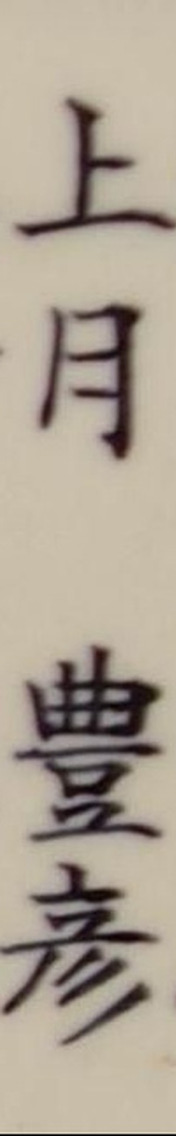上月豊彦
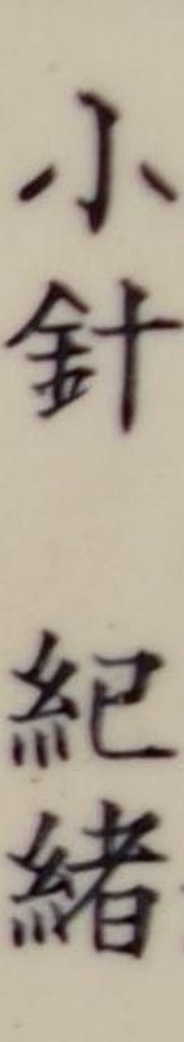小針紀緒
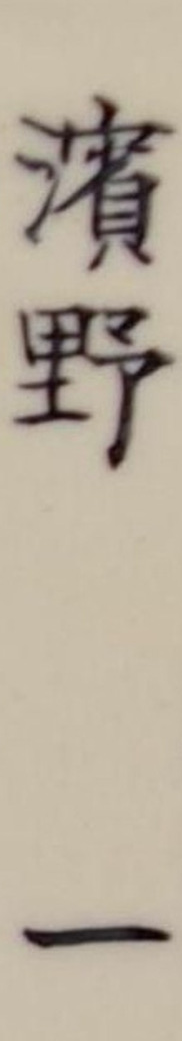濱野一
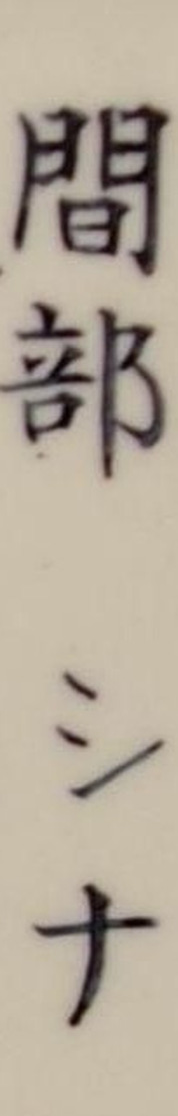間部シナ
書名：M~S
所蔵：高野山金剛峯寺
